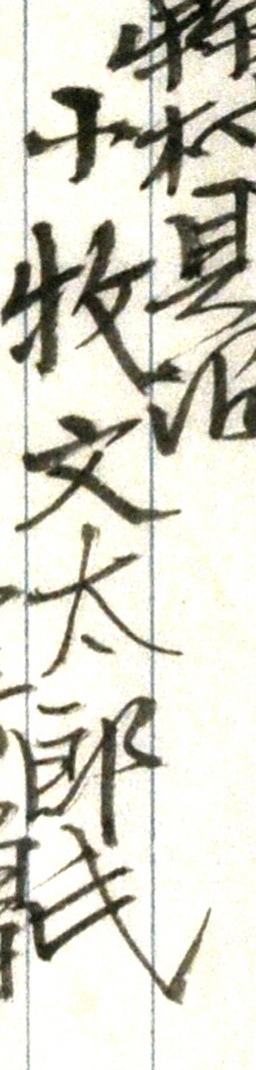小牧文太郎氏

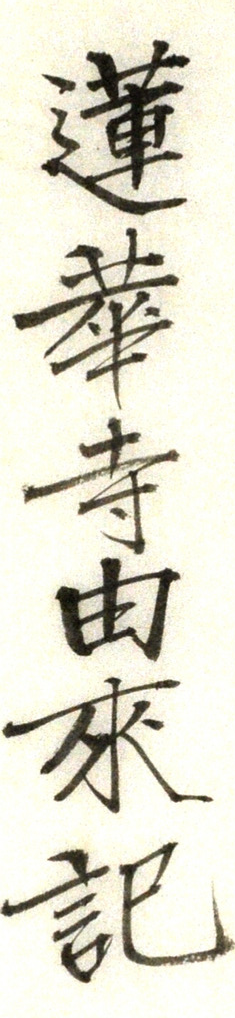蓮華寺由来記
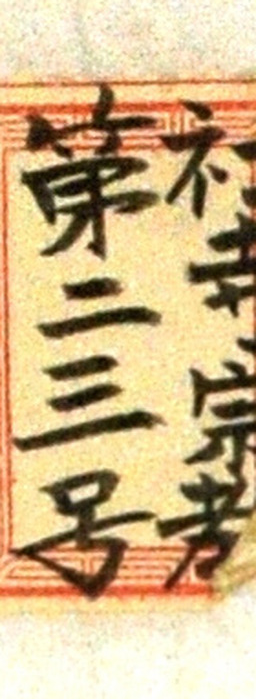第二三号

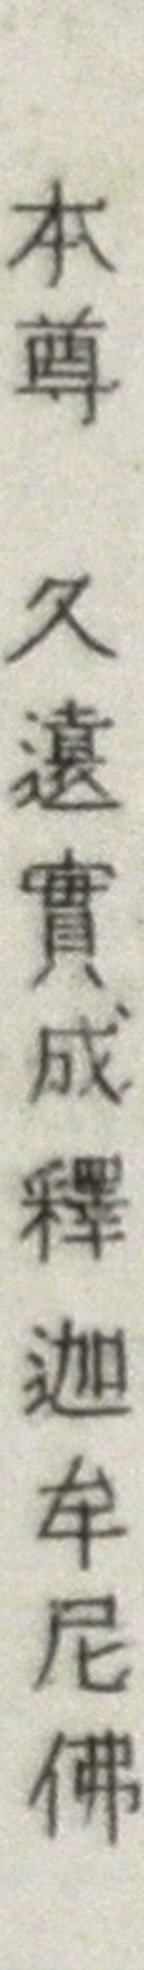本尊久遠実成釈迦牟尼仏
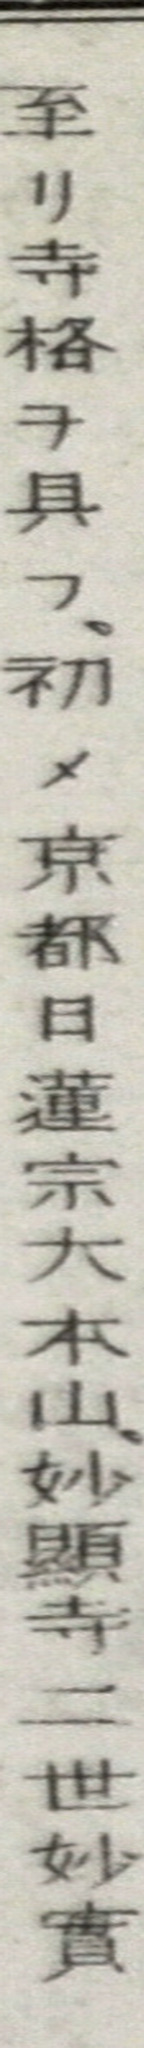至リ寺格ヲ具フ、初メ京都日蓮宗大本山、妙顕寺二世妙実
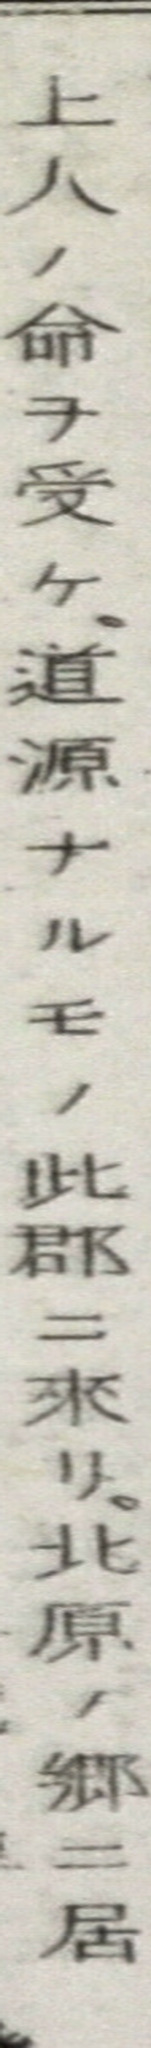上人ノ命ヲ受ケ、道源ナルモノ此郡ニ来リ、北原ノ郷ニ居
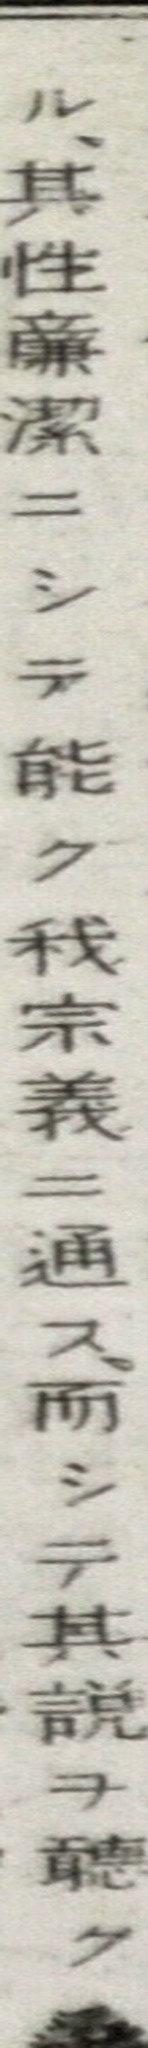ル、其清廉潔ニシテ能ク我宗義ニ通ス、而シテ其説ヲ聴ク
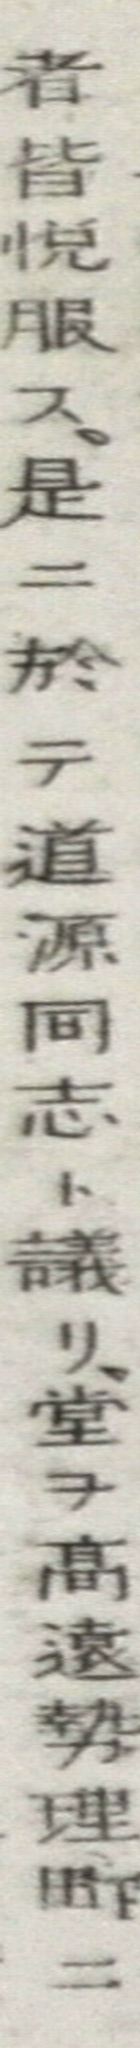者皆悦服ス、是ニ於テ道源同志ト議リ、堂ヲ高遠勢理町ニ
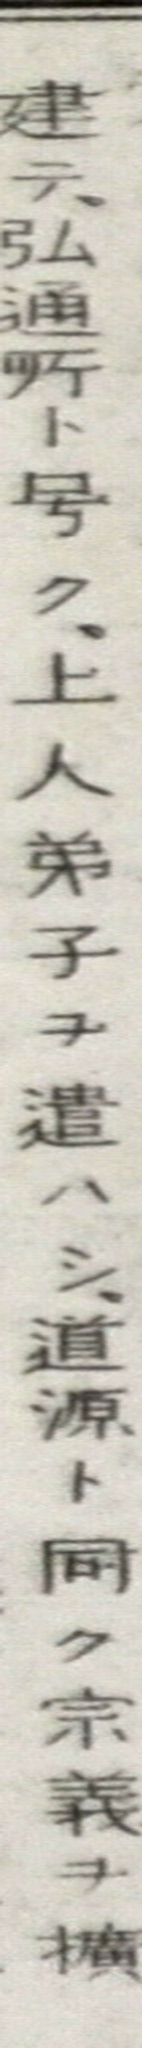建テ、弘通所ト号ク、上人弟子を遣ハシ、道源ト同ク宗義ヲ拡
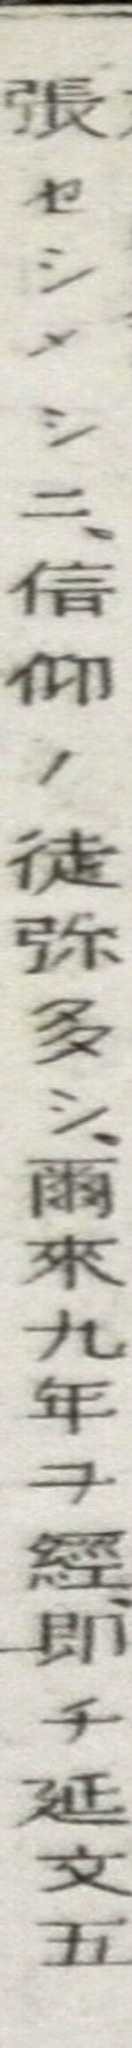張セシメシニ、信仰ノ徒弥多シ、爾来九年ヲ経、即チ延文五
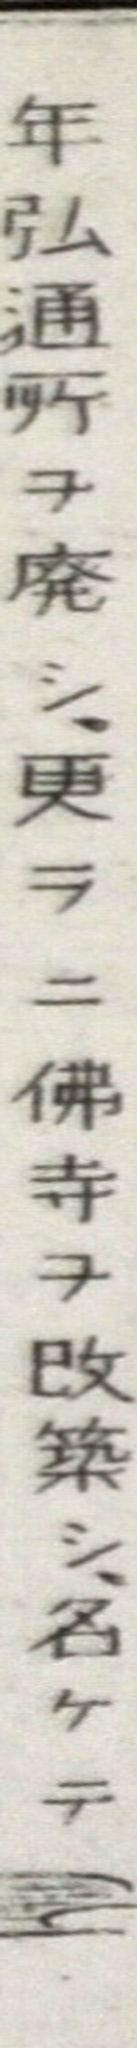年弘通所ヲ廃シ、更ラニ仏寺ヲ改築シ、名ケテ
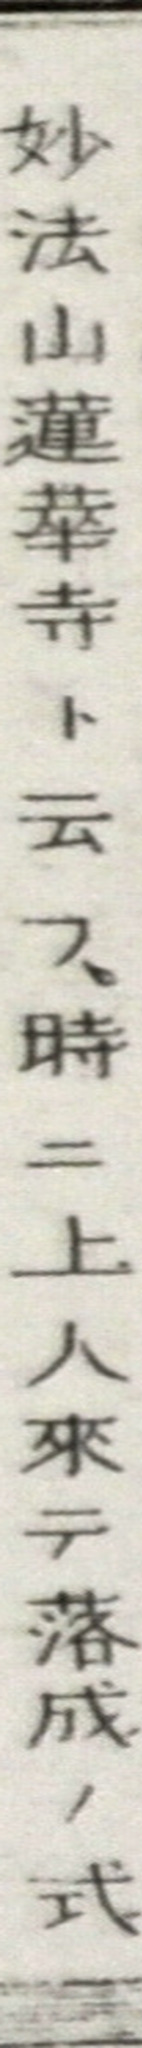妙法山蓮華寺ト云フ、時ニ上人来テ落成ノ式
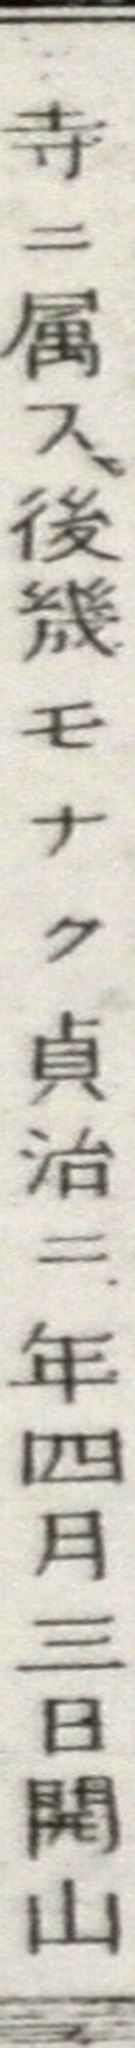寺ニ属ス、後幾モナク貞治二年四月三日開山
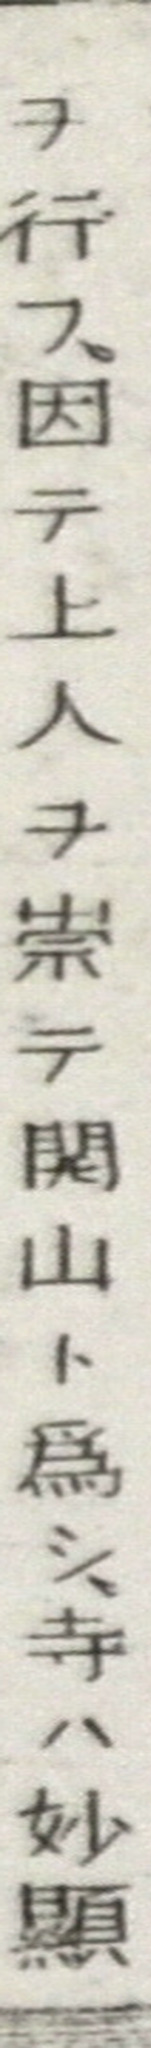ヲ行フ、因テ上人ヲ崇テ開山ト為シ、寺ハ妙顕
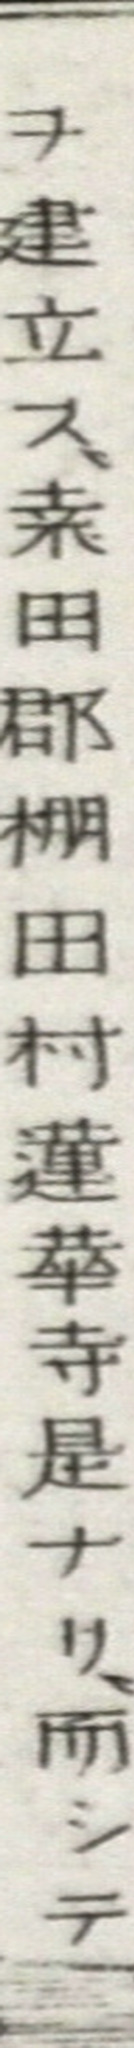ヲ建立ス、田郡棚田村蓮華寺是ナリ、而シテ
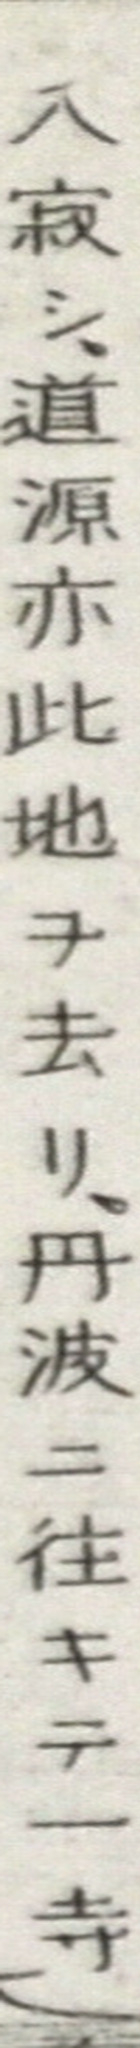入寂シ、道源亦此地ヲ去リ、丹波ニ往キテ一寺
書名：桂泉院・樹林寺・東光寺縁起書、蓮華寺由来書、付夕顔観音記
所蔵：伊那市立高遠町図書館・合同会社AMANE
